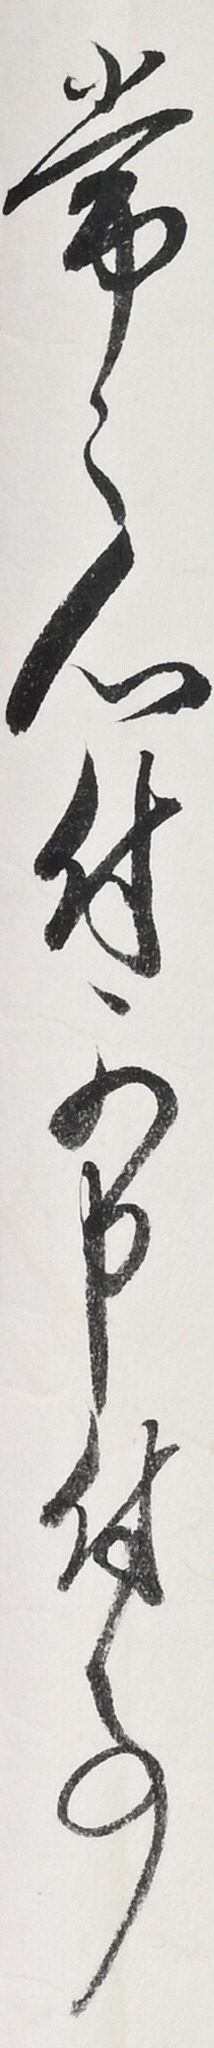常々心付可申付事
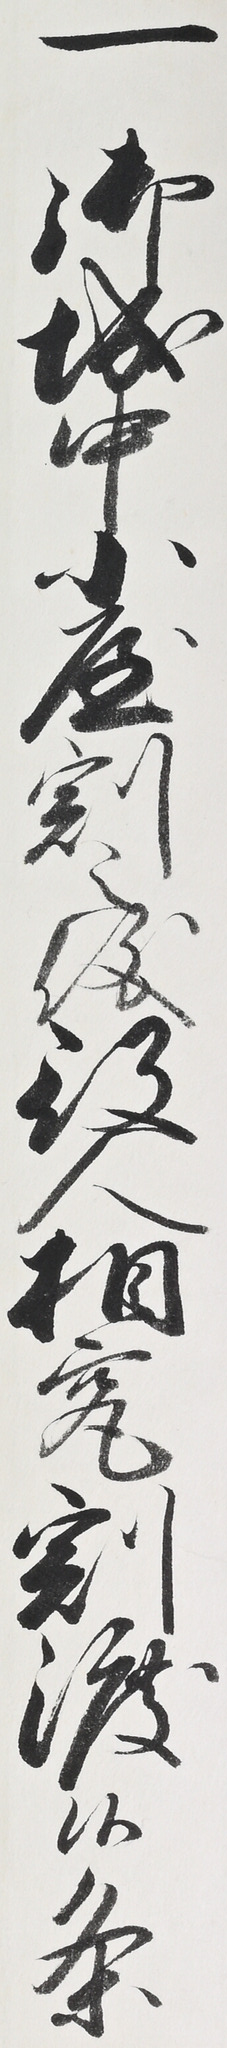一御城中小屋割之儀役人相究割渡候条
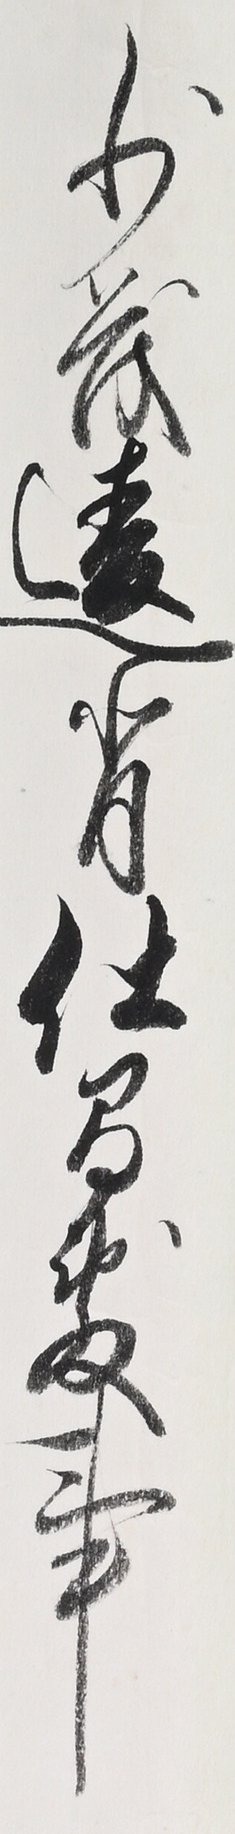少茂違背仕間敷事
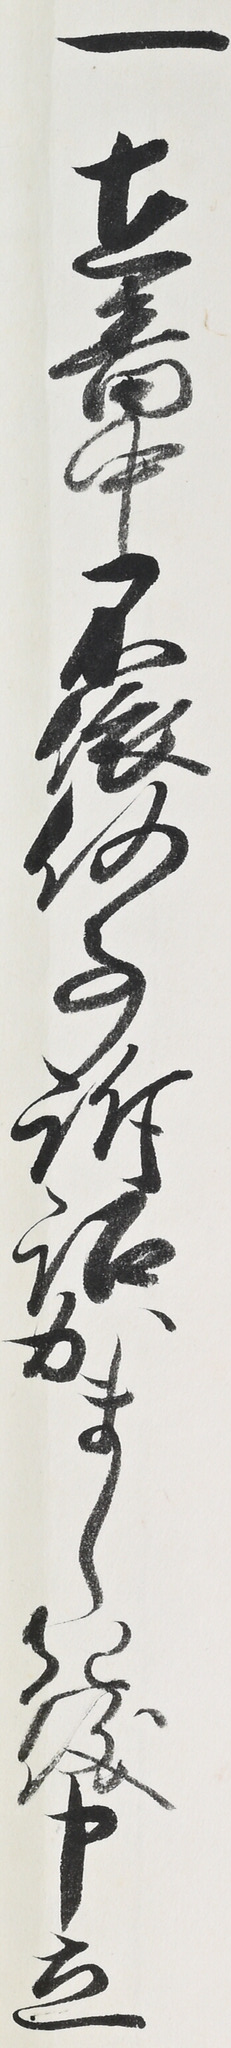一在番中不依何事訴訟かましき儀申立
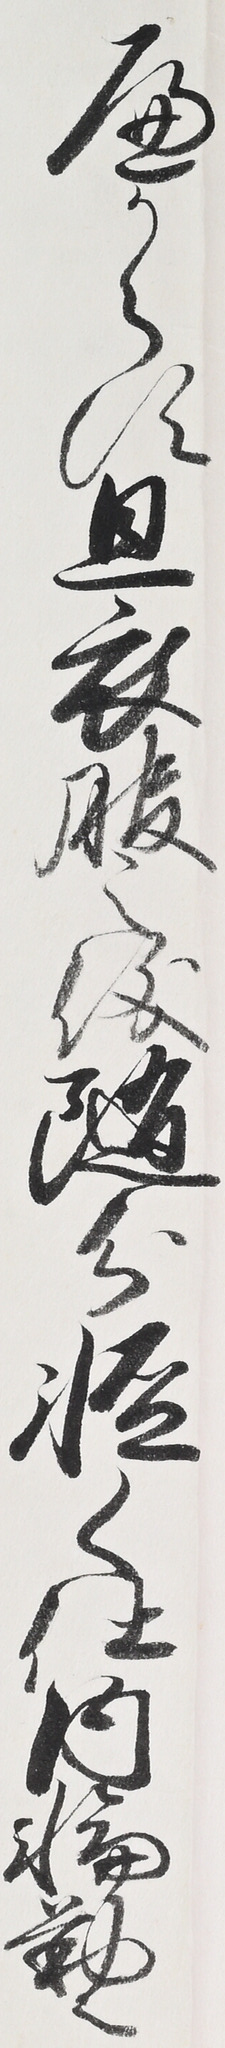へからす且衣服之儀随分軽く仕内輪勤之
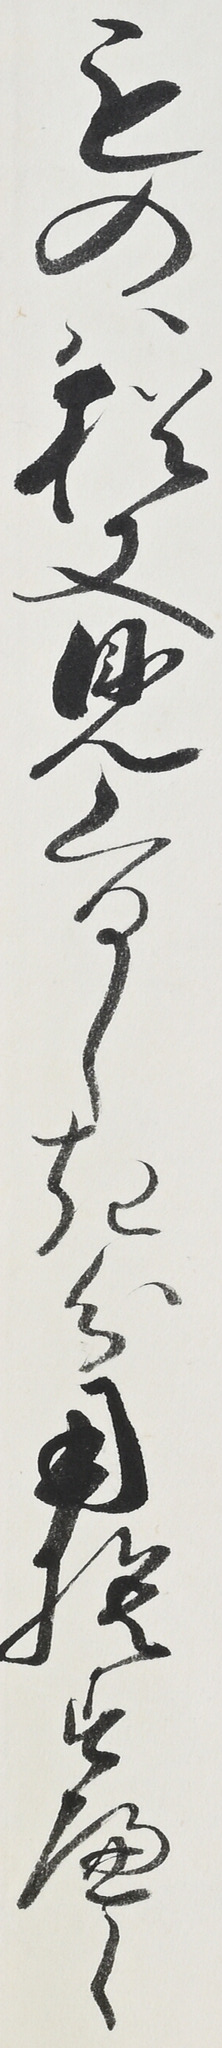ものハ猶又見くるしき分用捨すへし
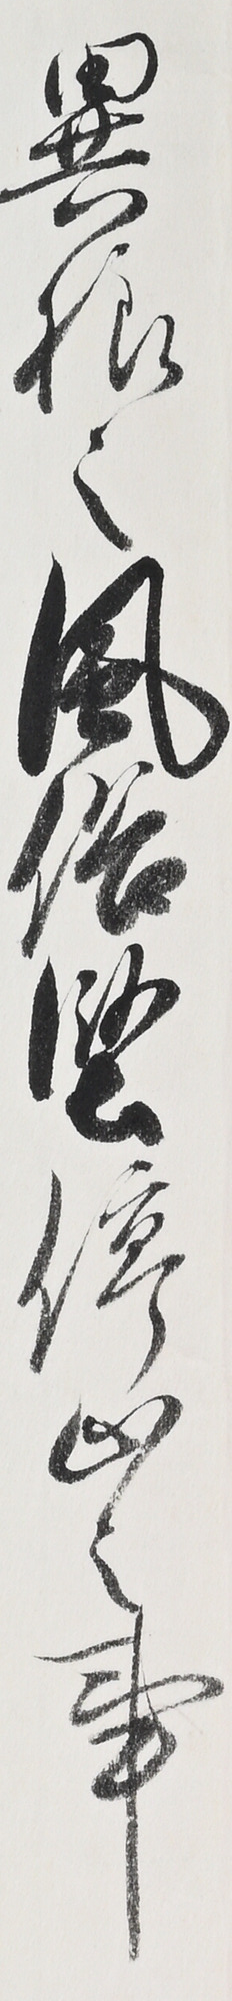異様之風俗堅停止之事
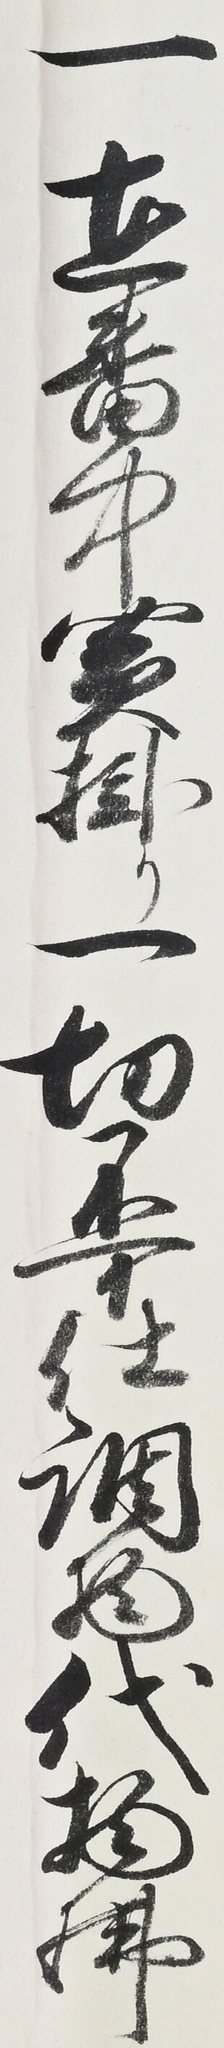一在番中買掛り一切不可仕調物代物払
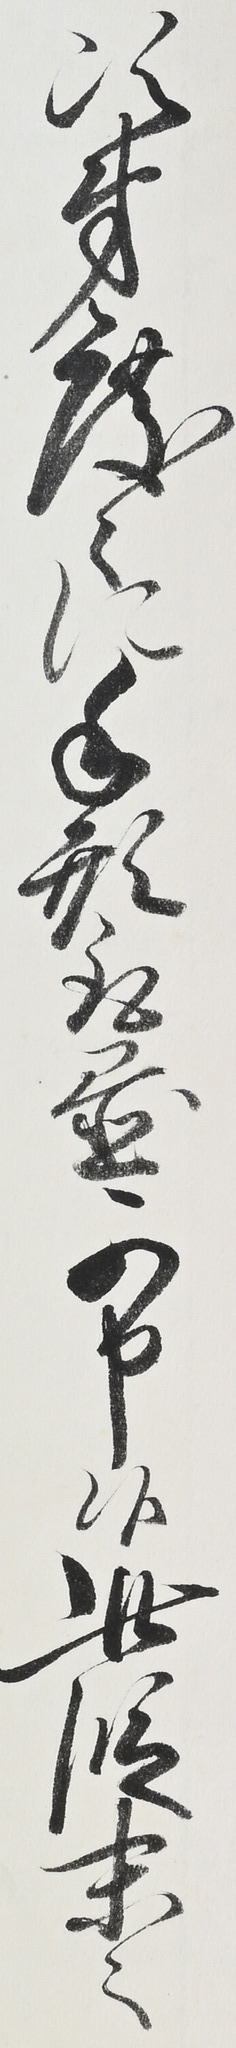次第度々に手形取置可申候此段末々
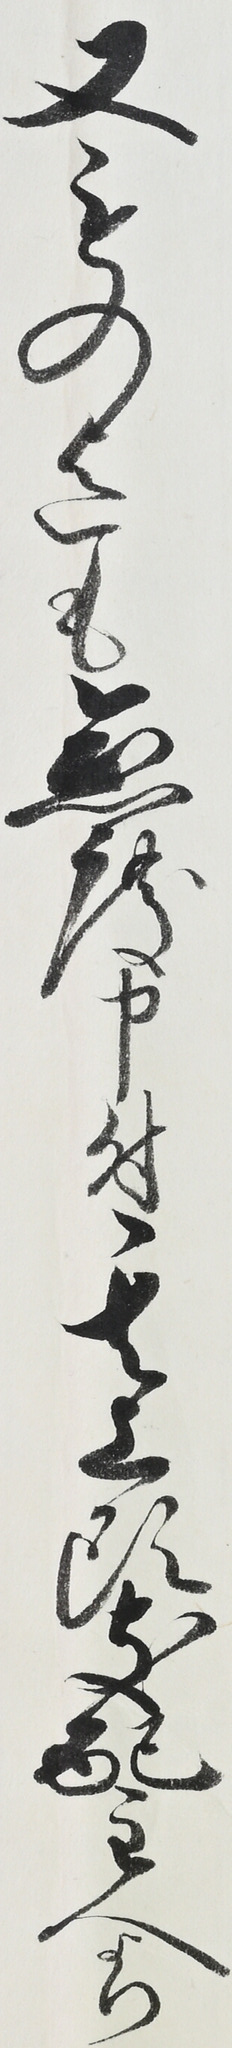又もの迄も急度申付其上頭支配主人より
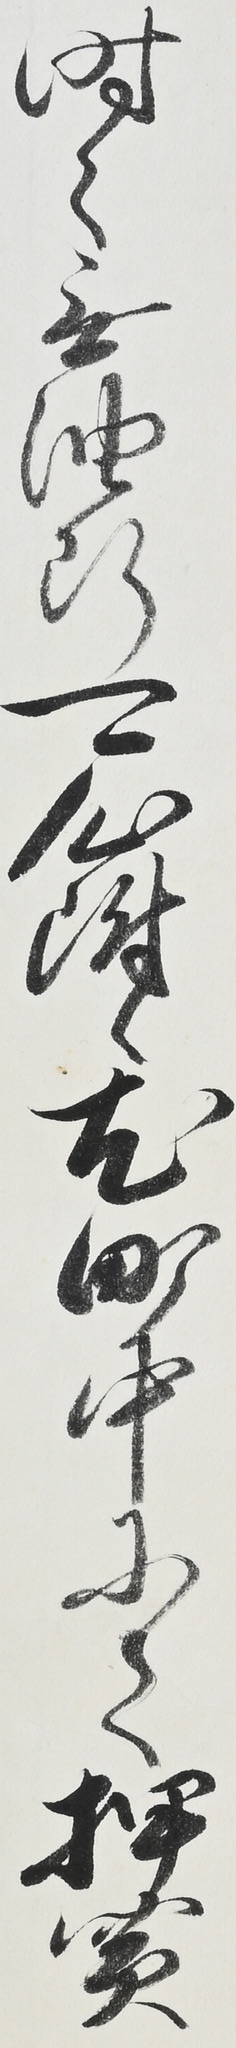時々無油断可心附候尤町中にて押買

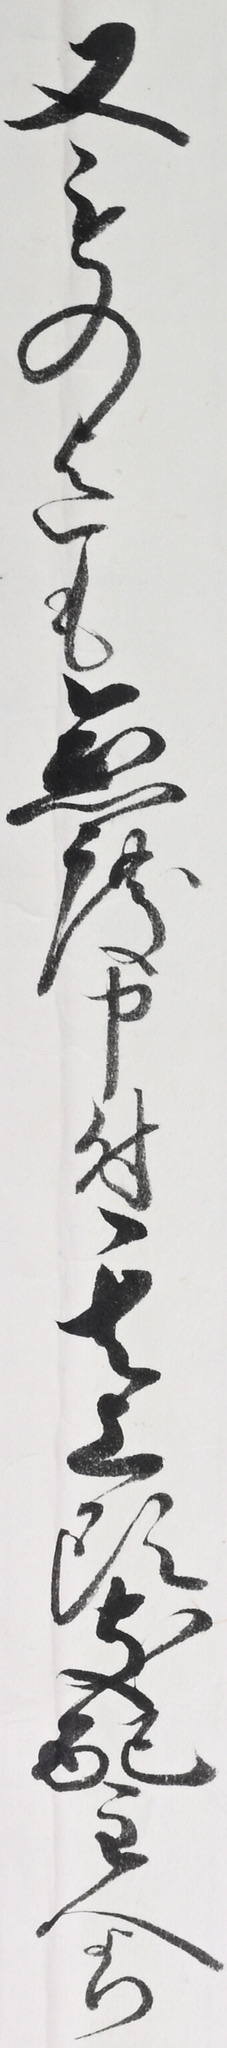又もの迄も急度申付其上頭支配主人より
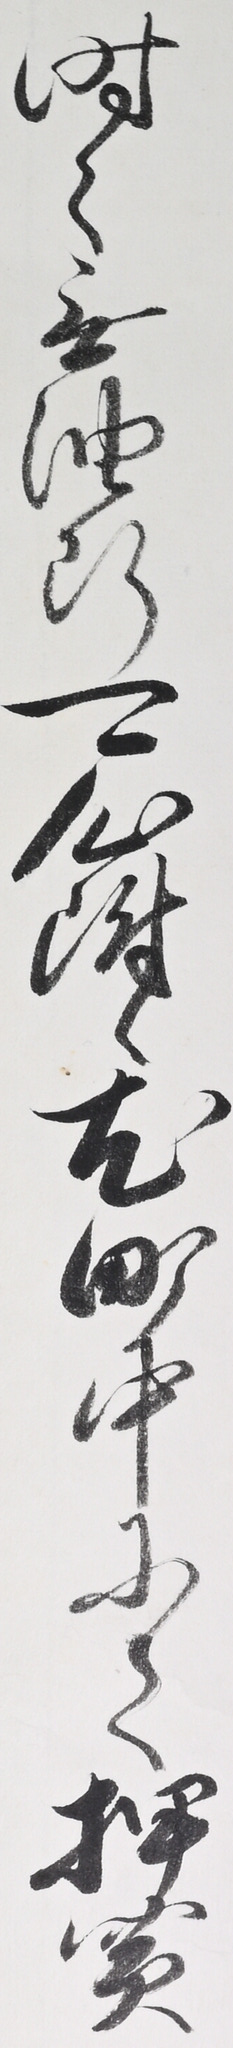時々無油断可心附候尤町中にて押買
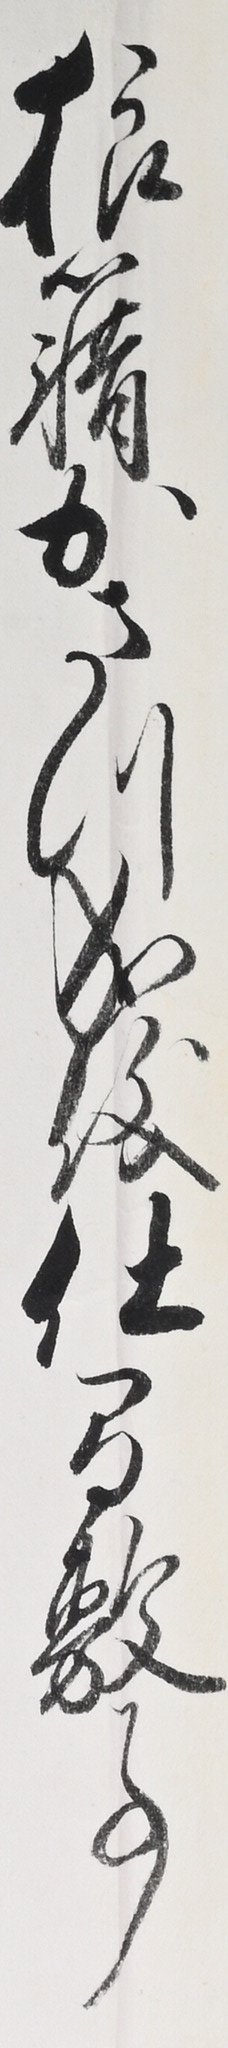狼藉かさつ成儀仕間敷事
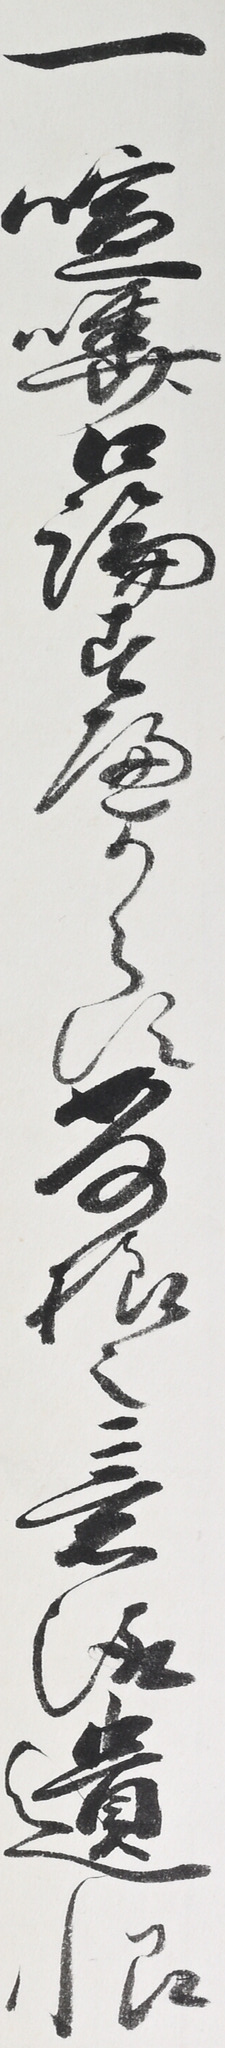一喧嘩口論すへからす如何様之意趣遺恨
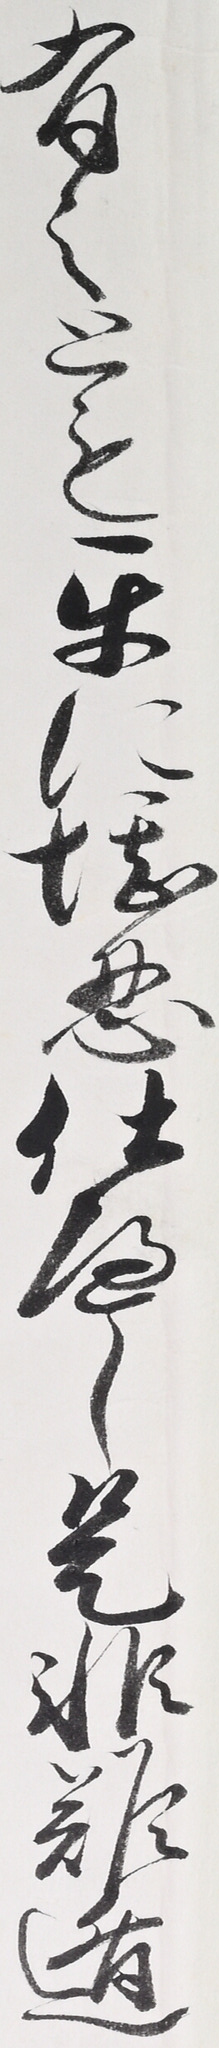有之とも互に堪忍仕へし是非難遁
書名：御条目
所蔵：伊那市立高遠町図書館・合同会社AMANE
